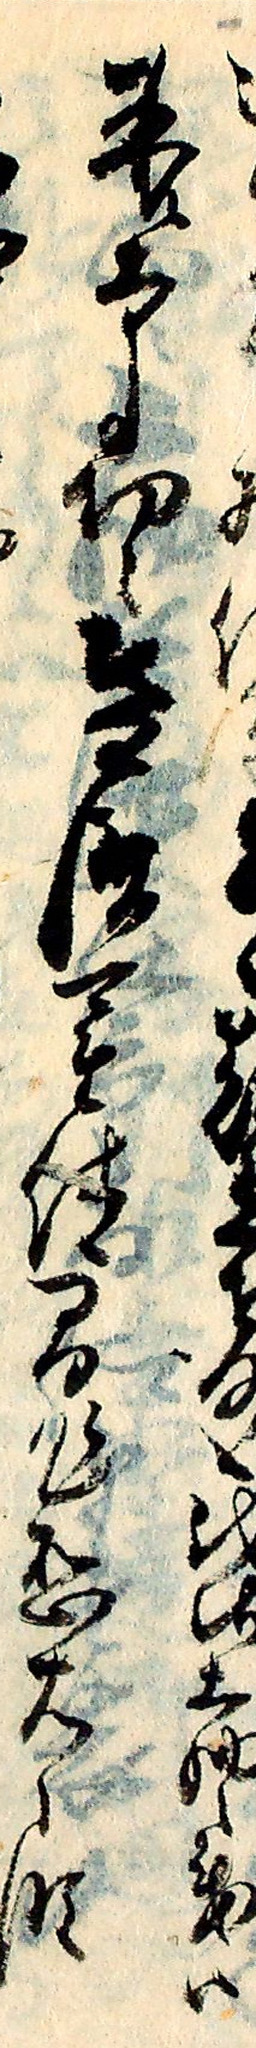来る十一月切に皆済可被仕候間乍恐右之段
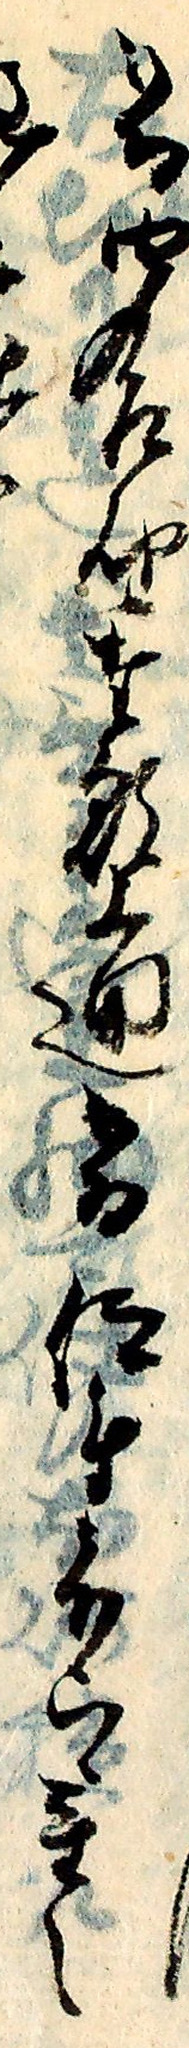被為聞召届奉願上通被為仰付被下候はゝ重々
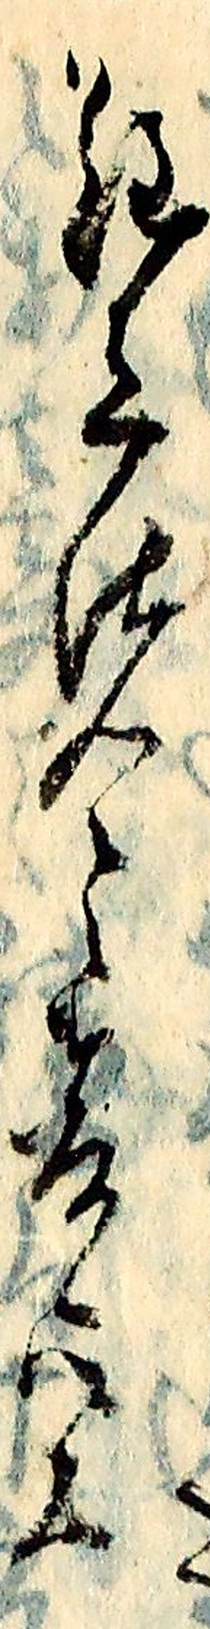難有仕合に奉存候以上
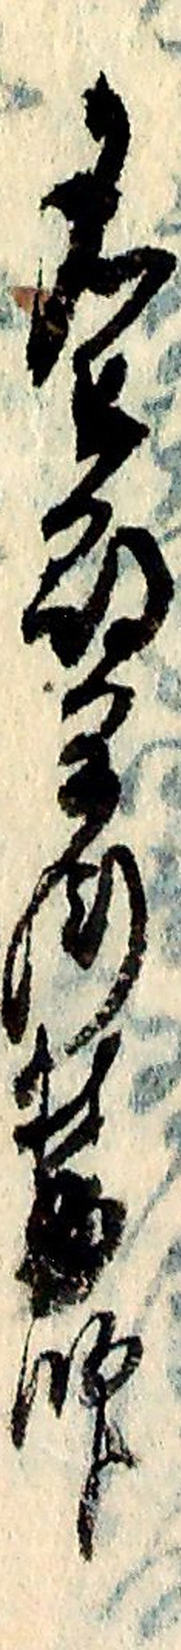名東郡早淵村玉師
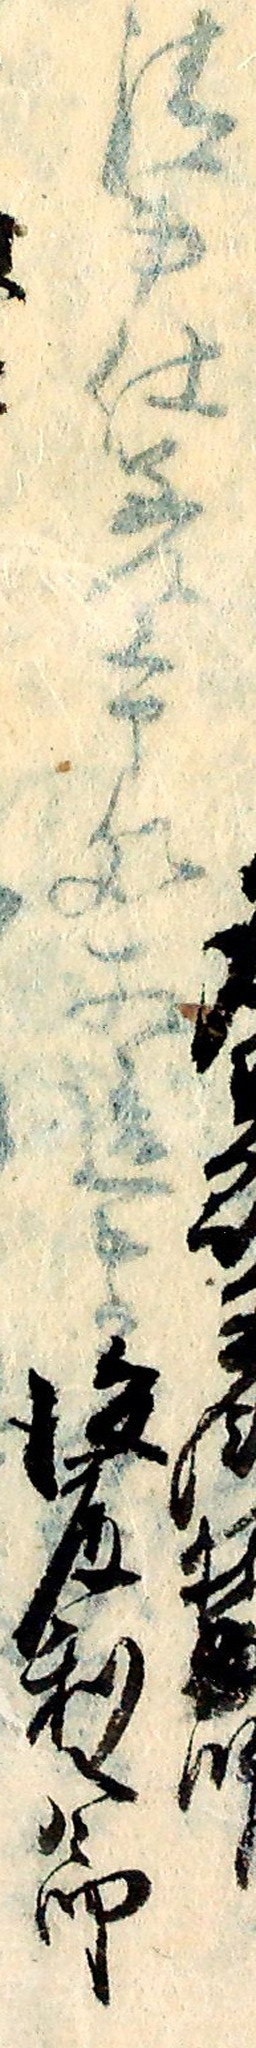後藤利八郎
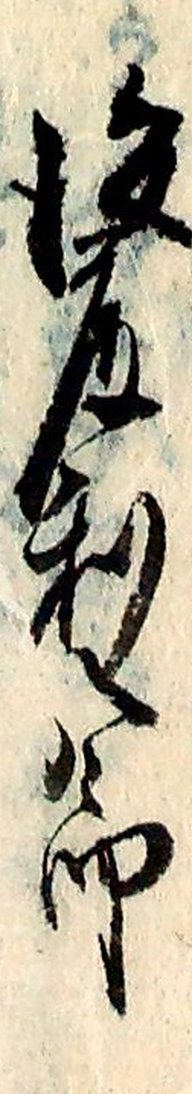後藤利八郎
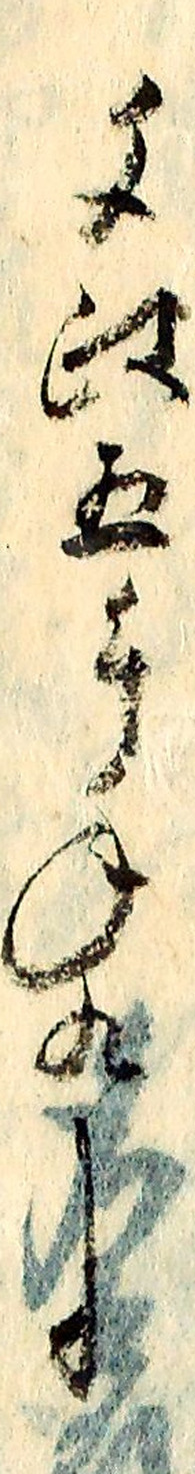文政五午年九月
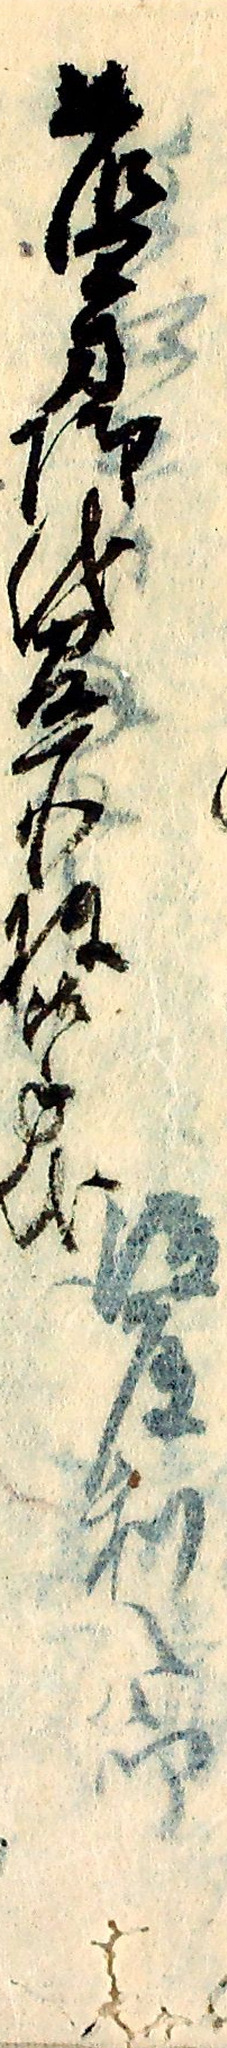藍方御代官所様御手代
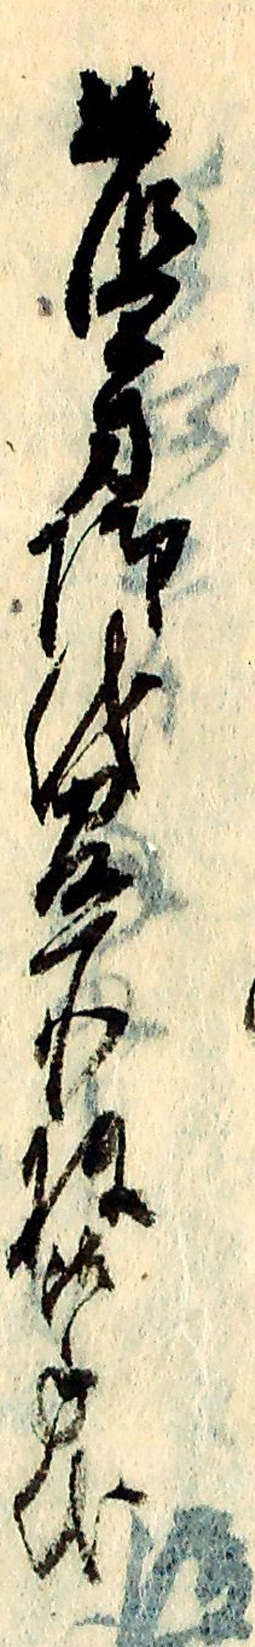藍方御代官所様御手代
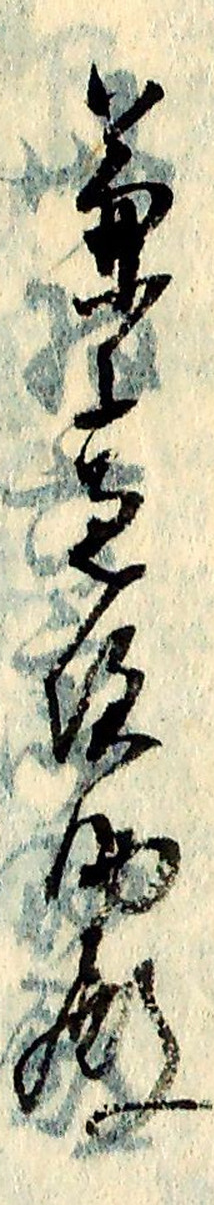兼子恵次助殿
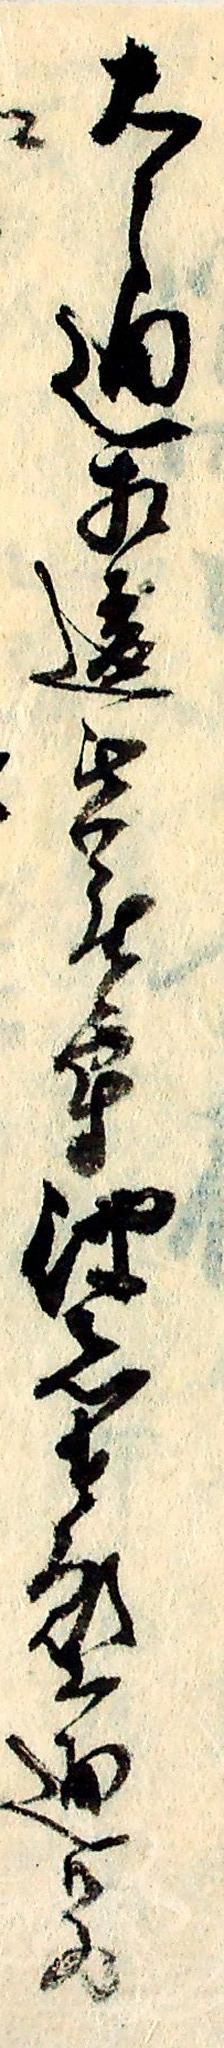右之通相違無御座候に付彼者奉願上通被為
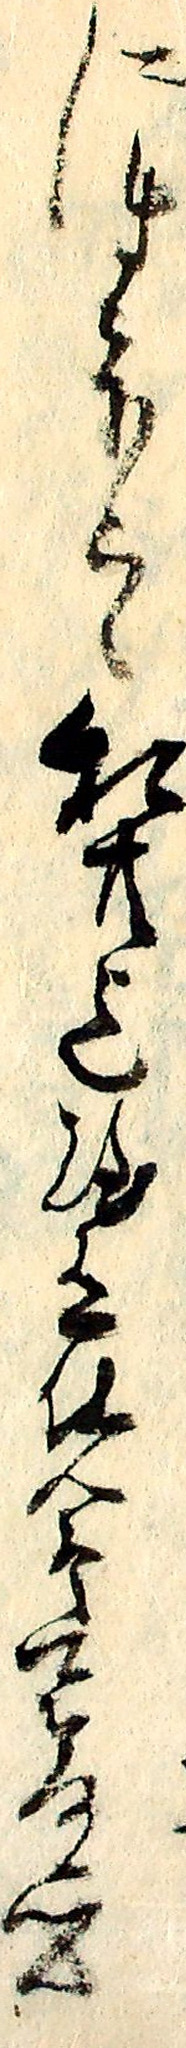仰付被下候はゝ私共迄難有仕合に可奉存候以上
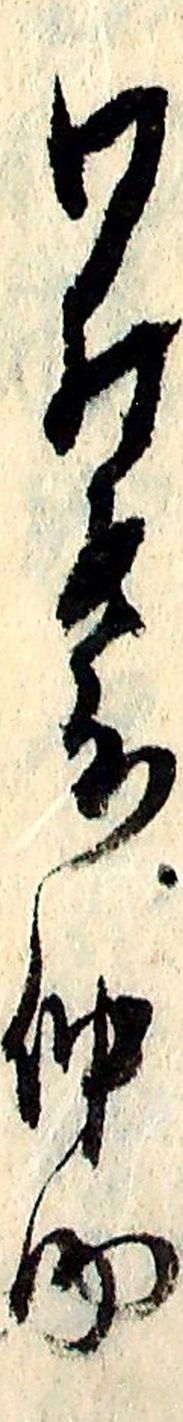同村庄屋」仲助
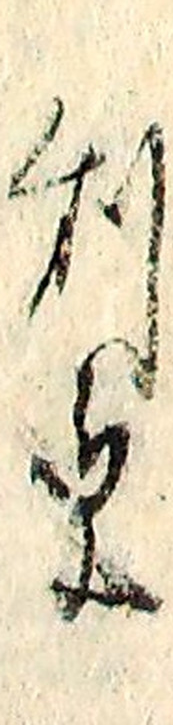利兵衛
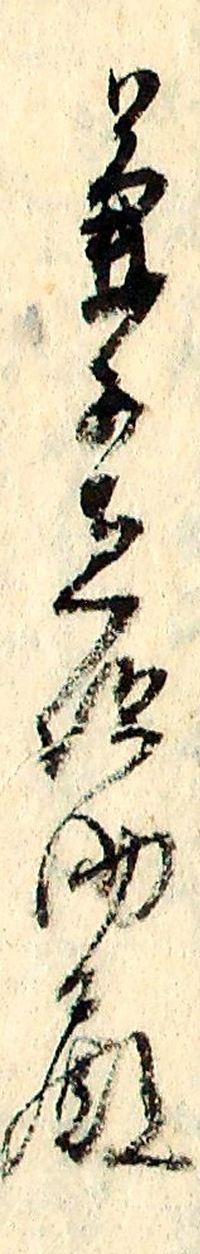兼子恵次助殿

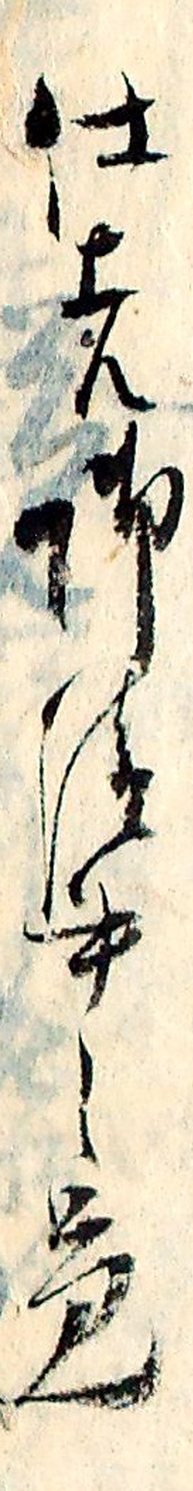仕上る御請書之覚
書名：諸御願書控(後藤氏壱番）
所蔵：鳴門教育大学 Naruto University of Education
